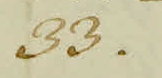33.
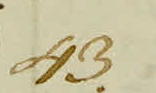43.
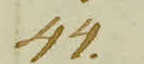44.
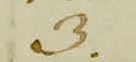3.
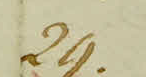29.
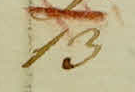13
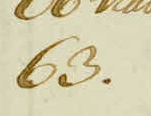63.
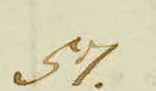57.
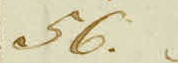56.
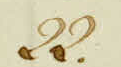22.
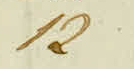12
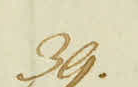39.
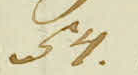54.
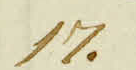17.
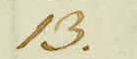13.
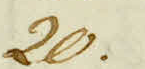20.
